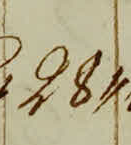28
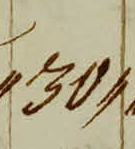30
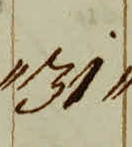31
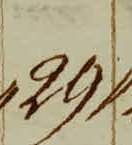29
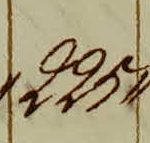225
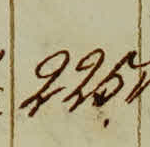225
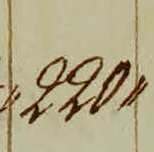220
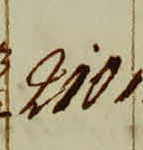210
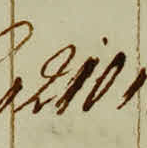210
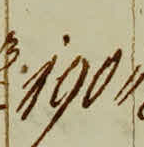190
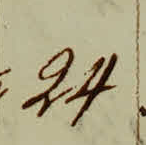24
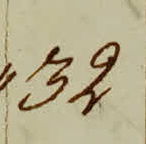32
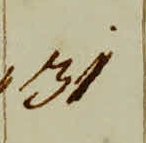31
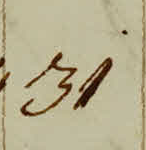31
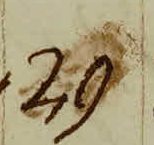29
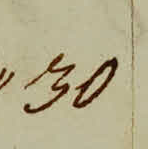30
